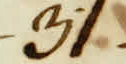31
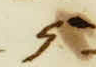5
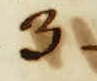3
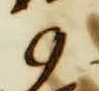9
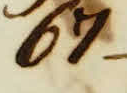67
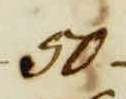50
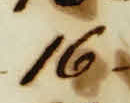16
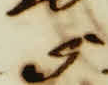5
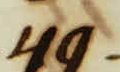49
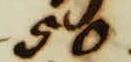50
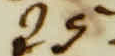25
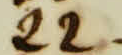22
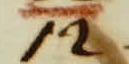12
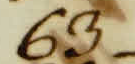63
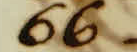66
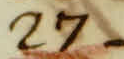27
